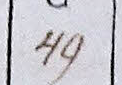49
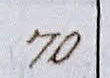70
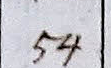54
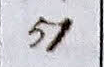51
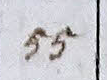55
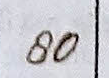80
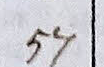57
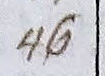46
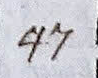47
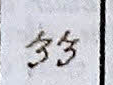33
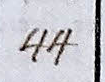44
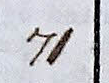71
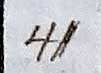41
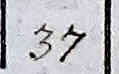37
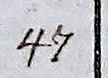47
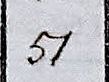51
